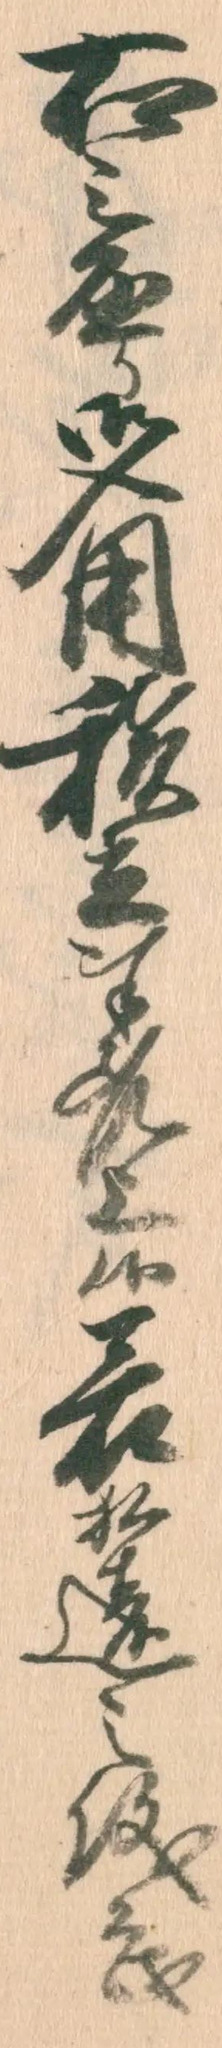右之通り御入用積立奉差上候若相違之義も
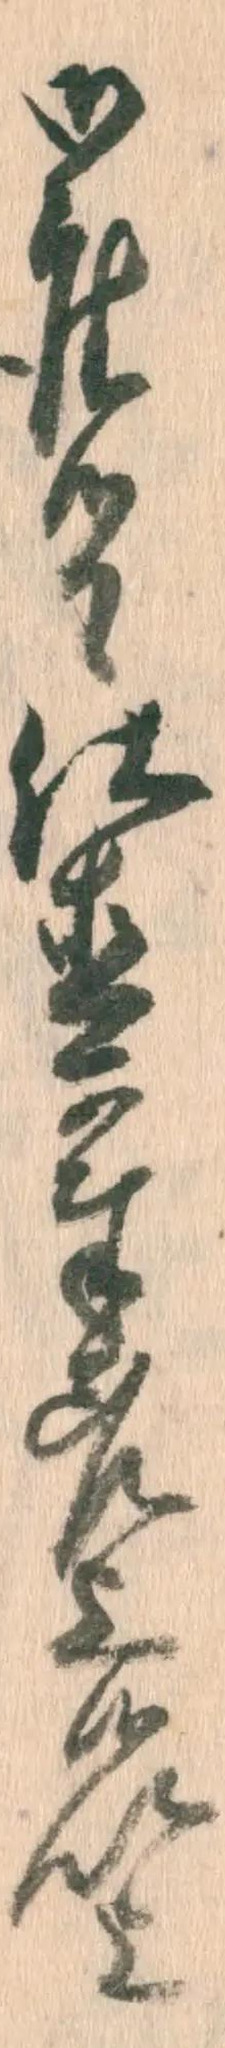御座候はゝ仕置可奉差上候以上
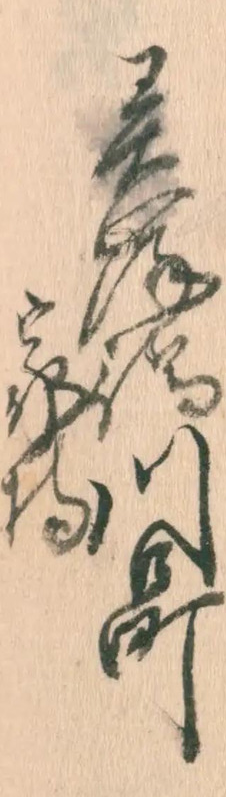霊岸嶋川口町
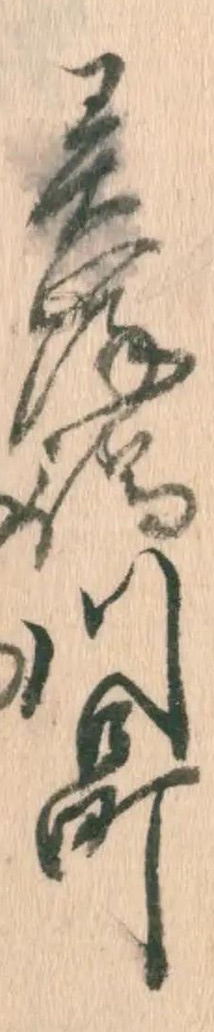霊岸嶋川口町
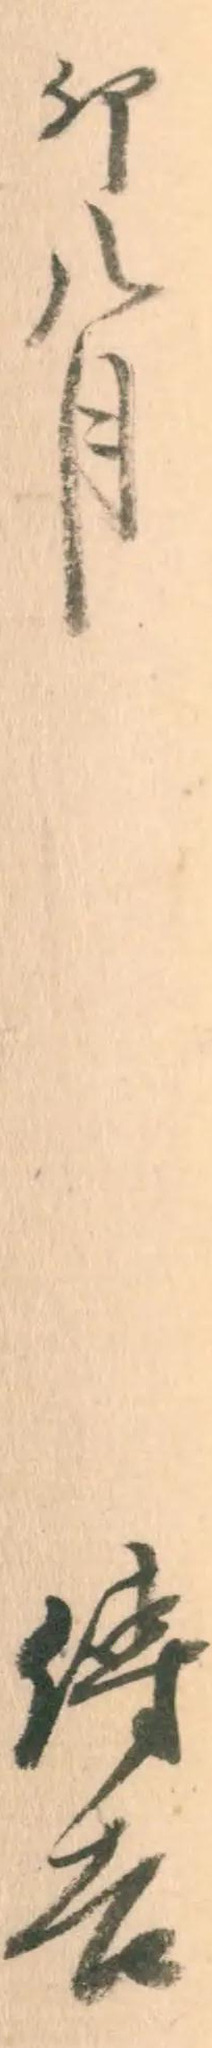卯八月伝吉

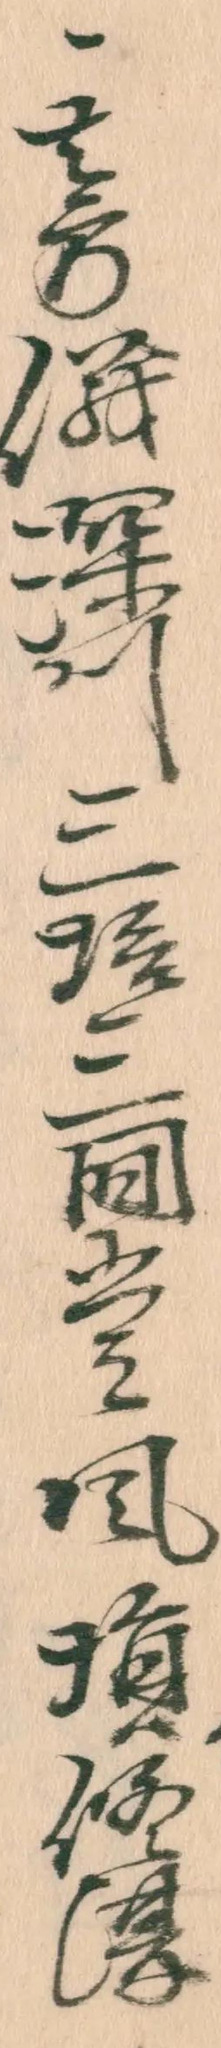一其方儀深川三拾三間堂風損修復
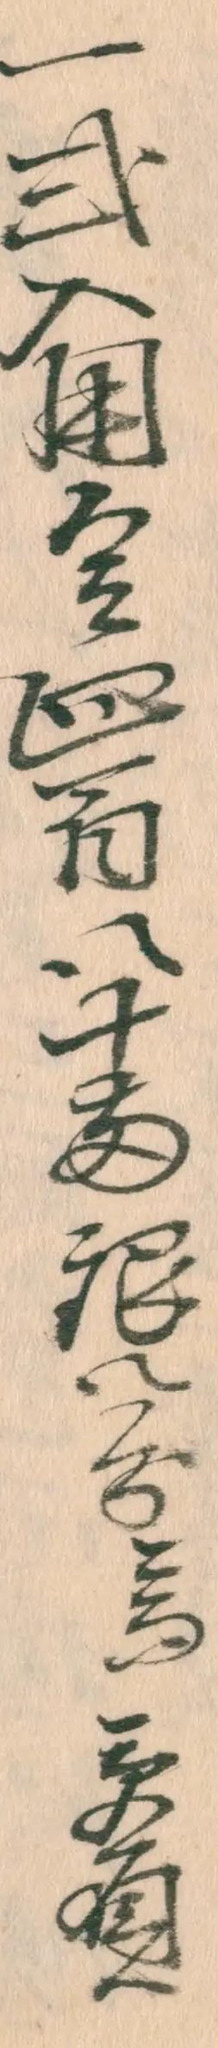一式入用金四百八十両銀八分為受負
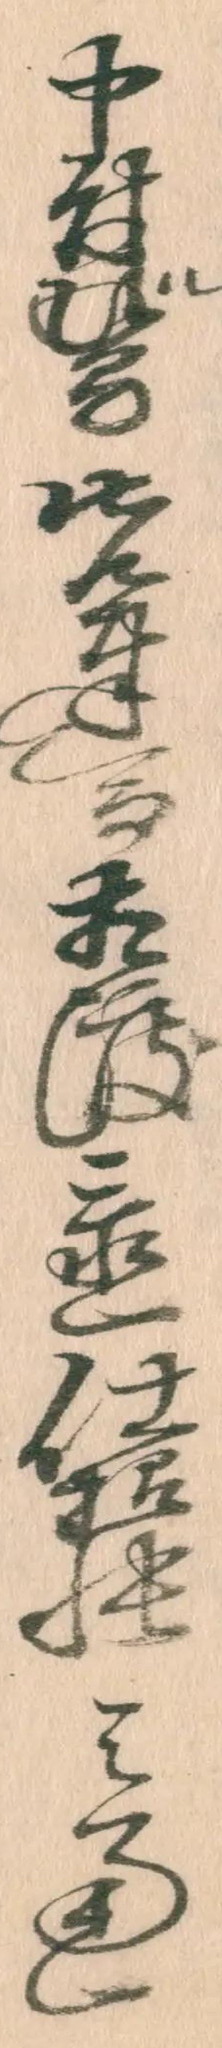申付る間先達而相渡置仕様帳之通
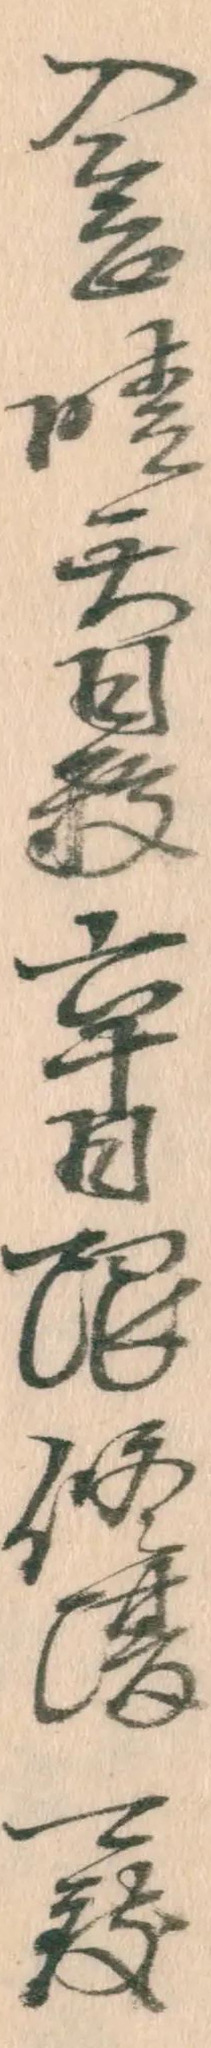入念晴天日数六十日限修復可致

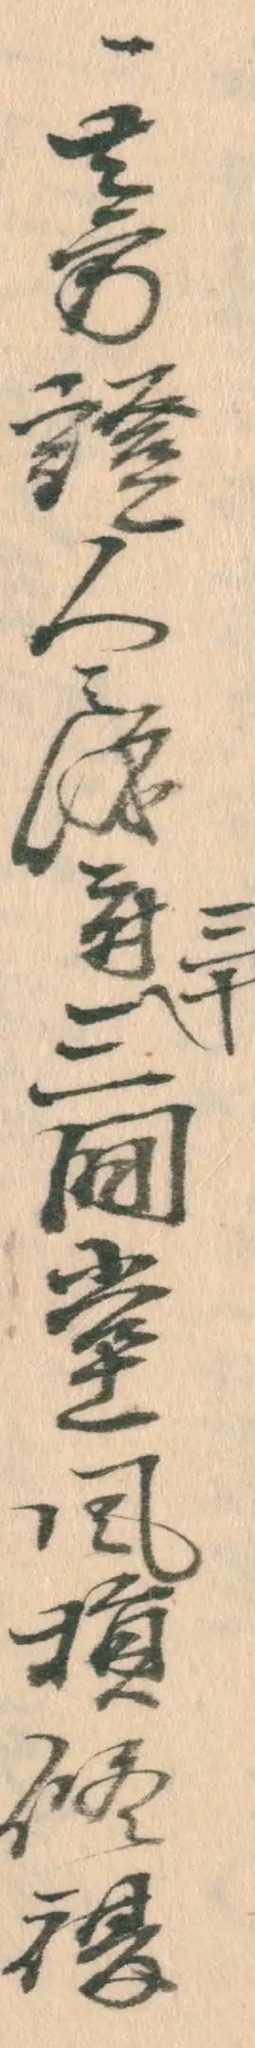一其方証人之儀に付三十三間堂風損修復
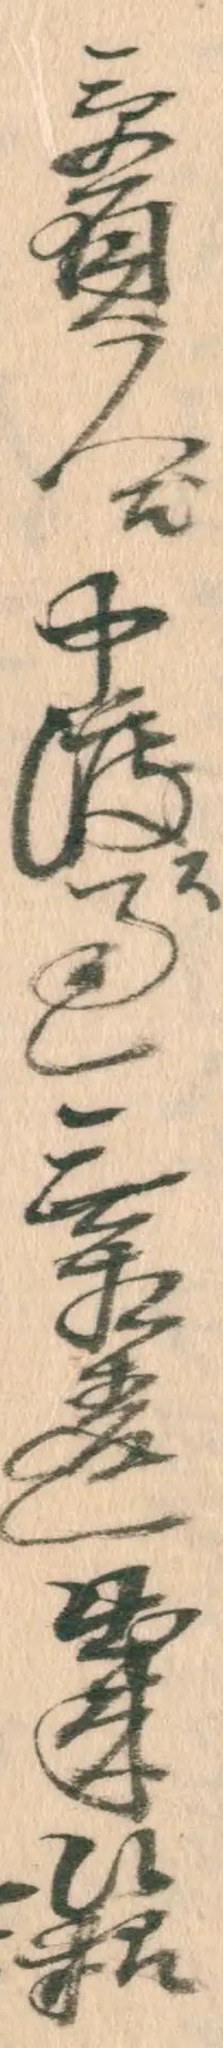受負人え申渡す通無相違出来候様
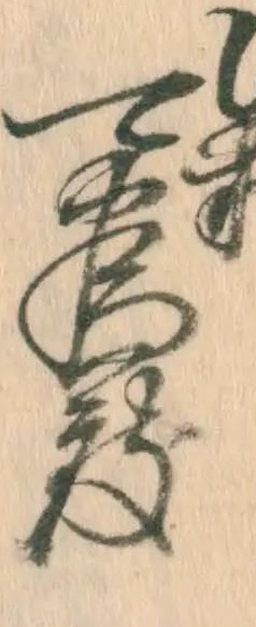可為致
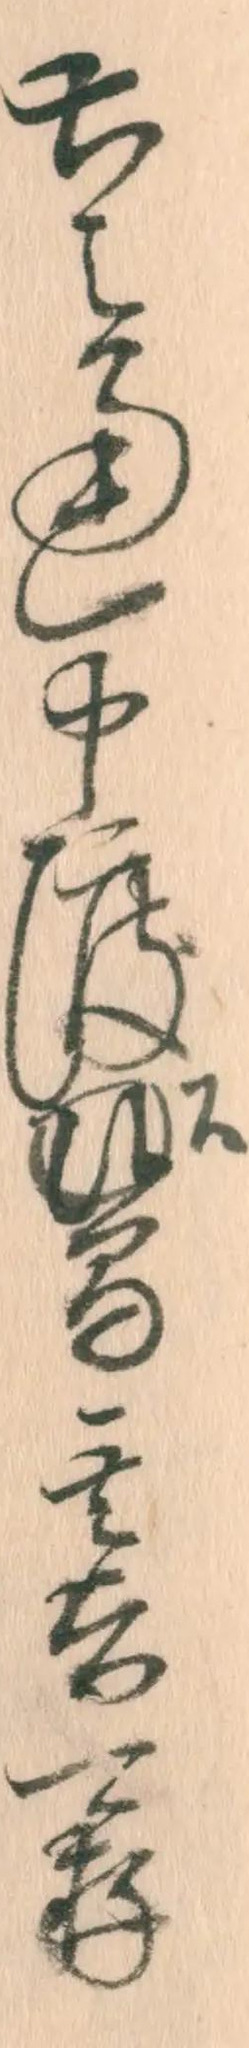右之通申渡す間其旨可存
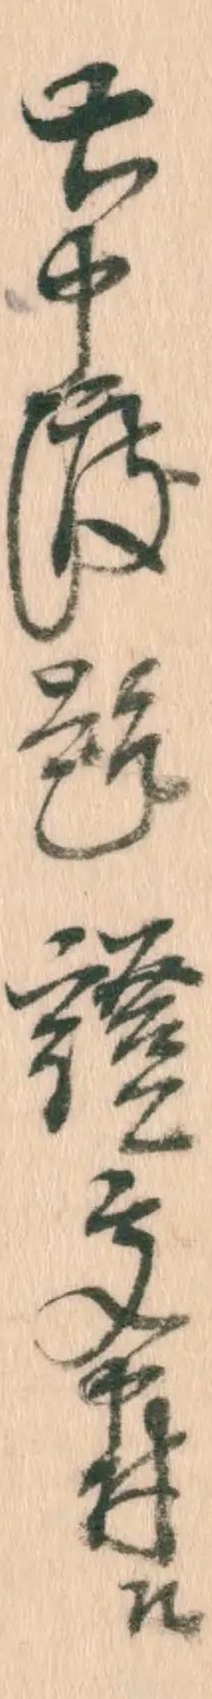右申渡趣証文申付る
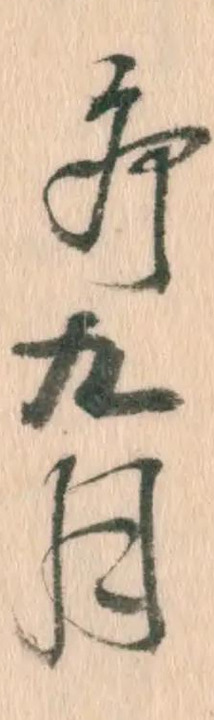卯九月
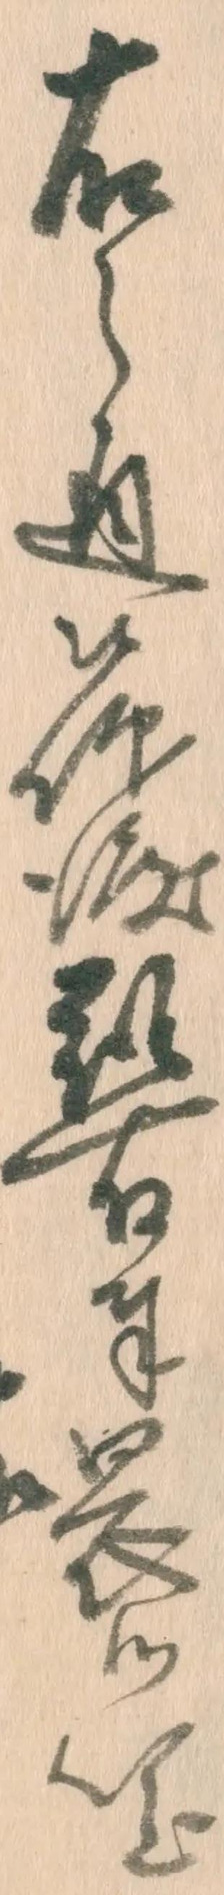右之通被仰渡難有奉畏候以上
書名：三十三間堂. [1]
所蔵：国立国会図書館 National Diet Library, JAPAN
